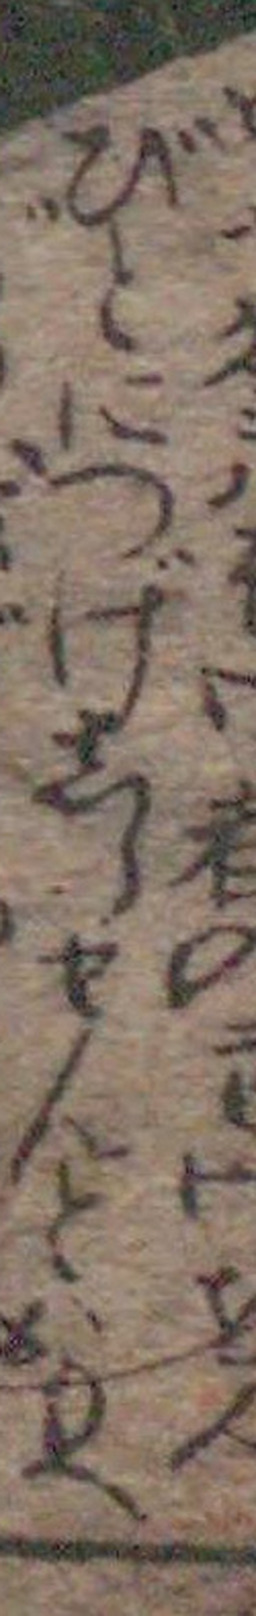びとにつげしらせんとおもへ
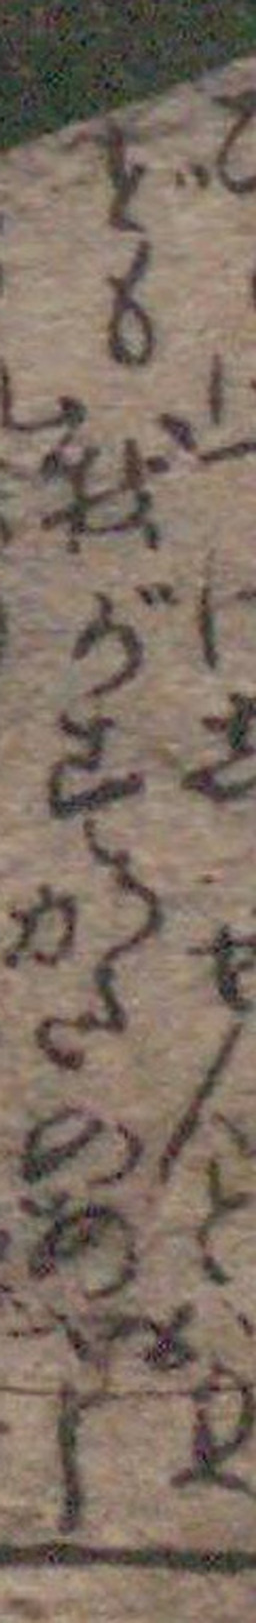ども我がすかたのあやし
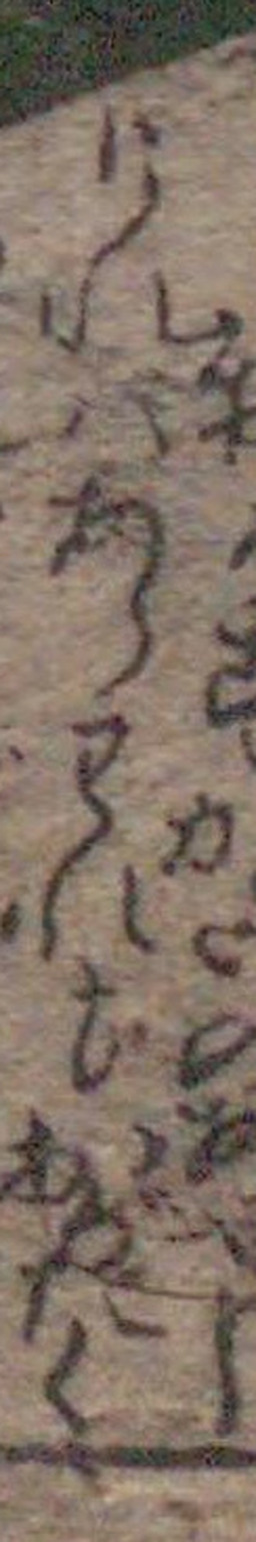けれはあらわれも出がたく
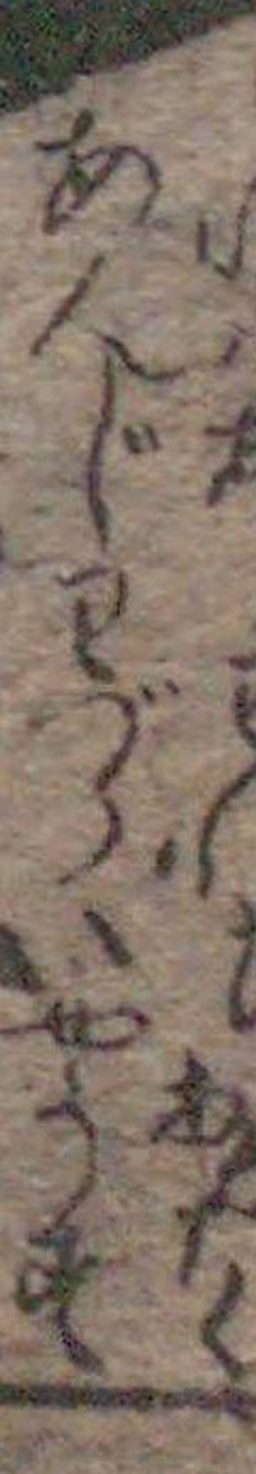あんじわづらいやうす
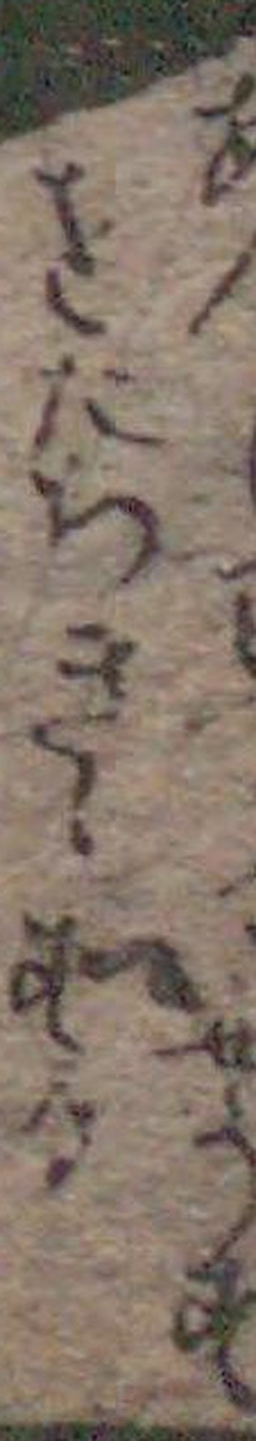をたちきゝする
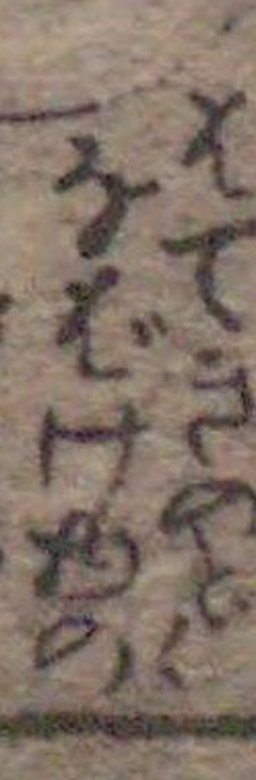なばけ物の
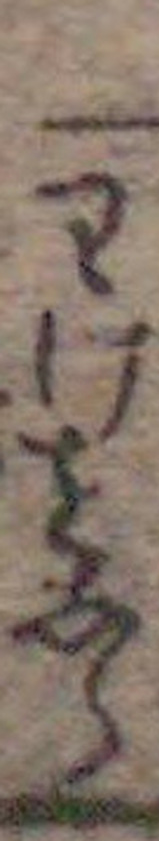わけをしら
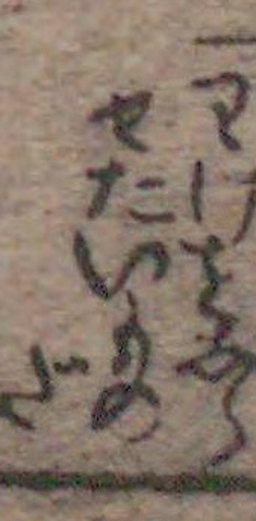せたいもの
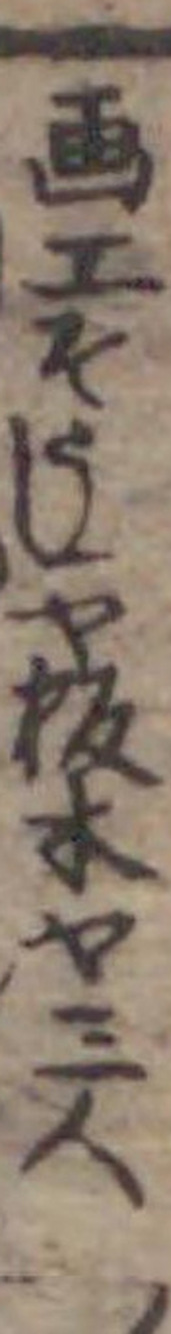画工そうしや板木や三人
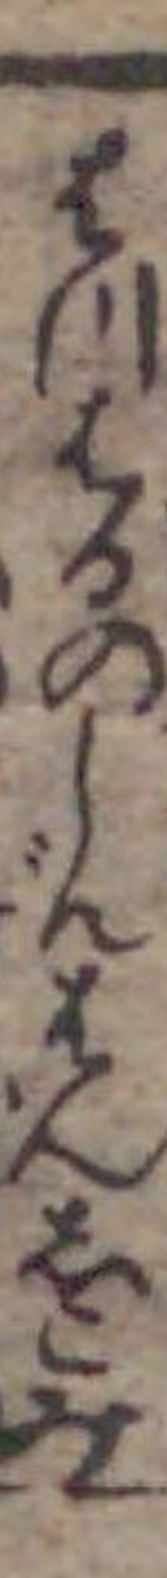はつはるのしんはんしこみ
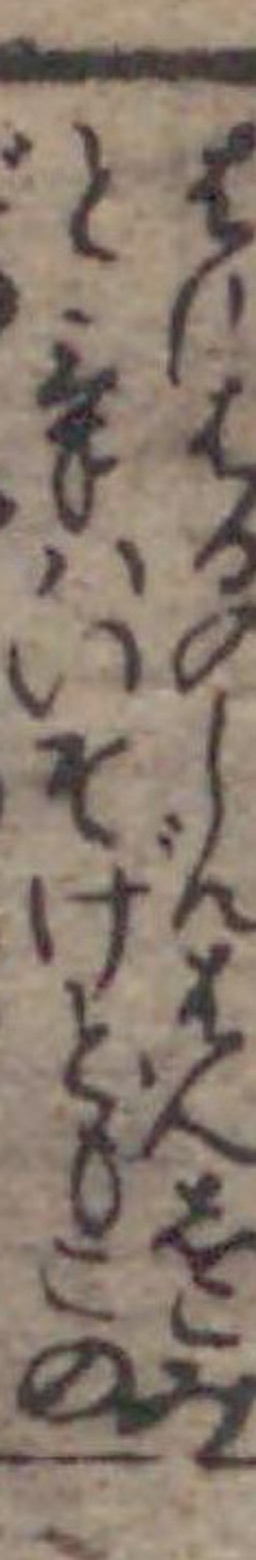と気はいそげどもこの
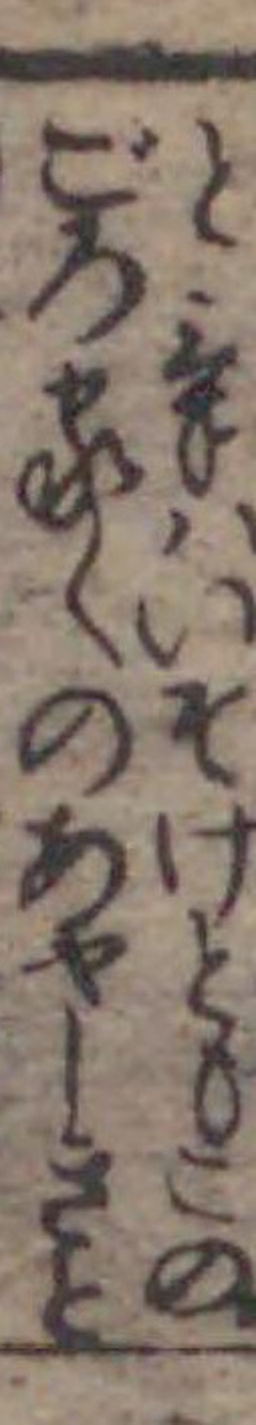ごろ家〳〵のあやしきこと
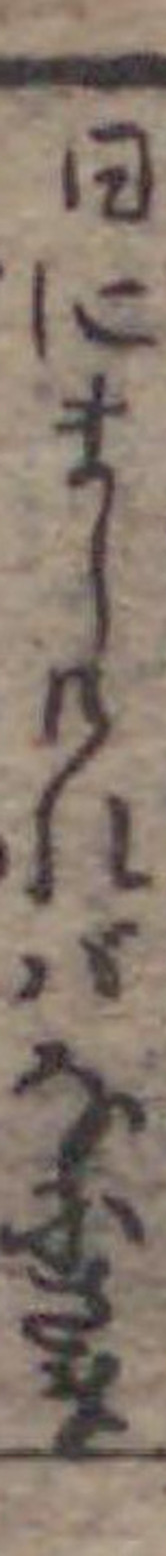日にましければなにさま
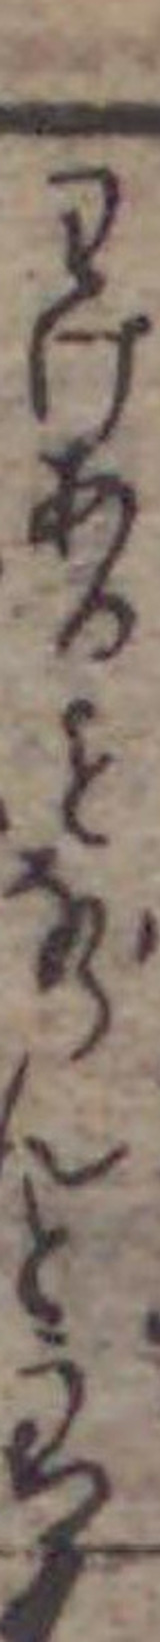わけあることならんとうち
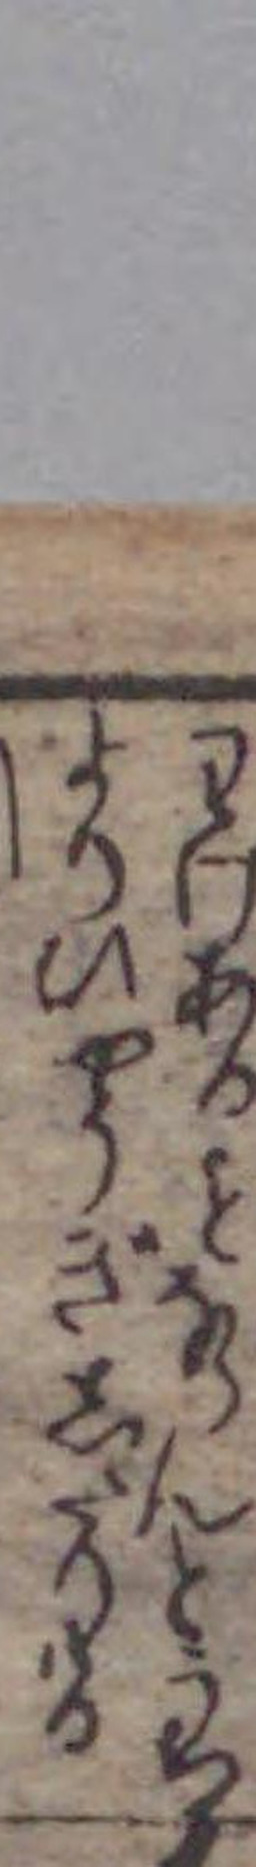よりひやうぎしたりける
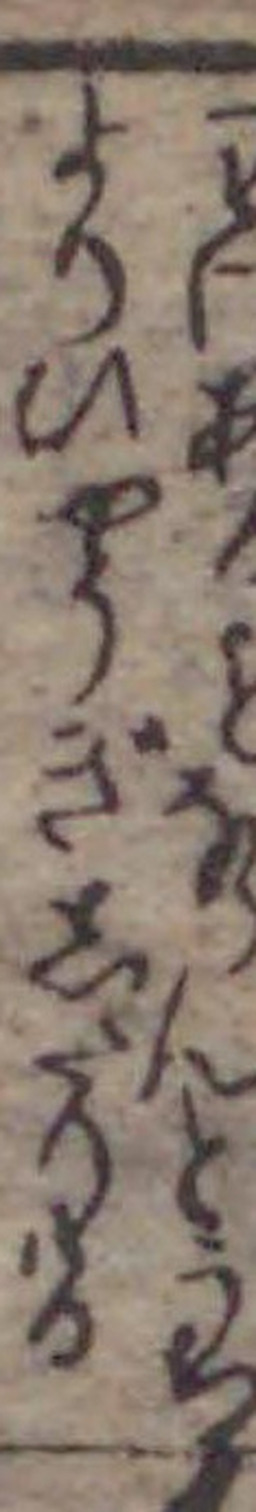よりひやうぎしたりける
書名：辞闘戦新根 （国会）
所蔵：国立国会図書館 National Diet Library, JAPAN
